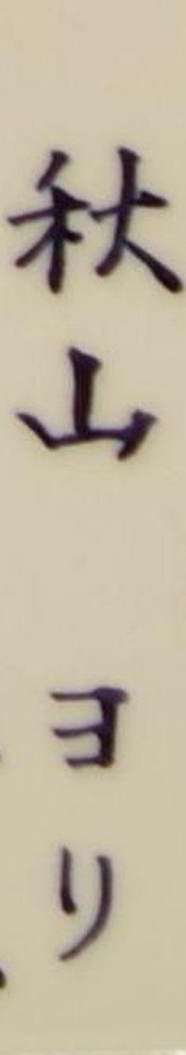秋山ヨリ
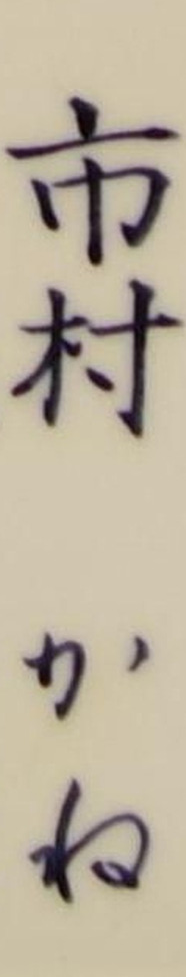市村かね
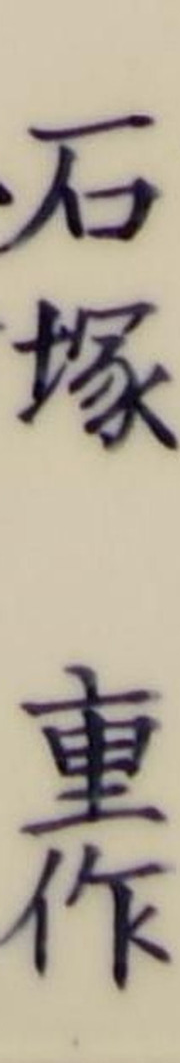石塚重作
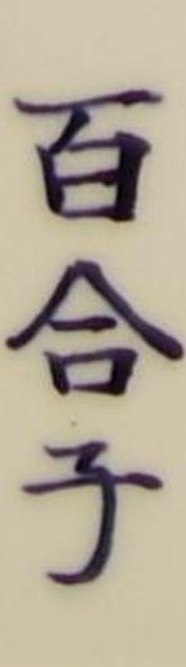百合子
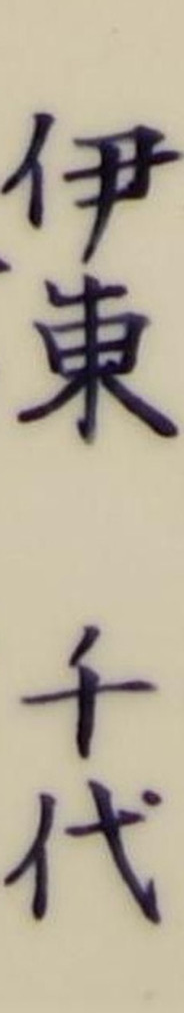伊東千代
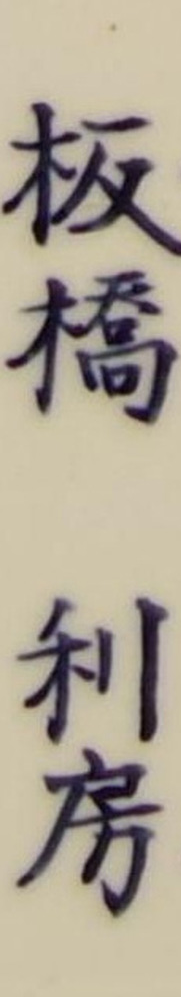板橋利房
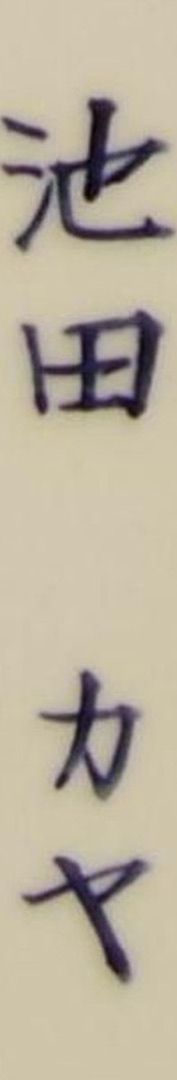池田カヤ
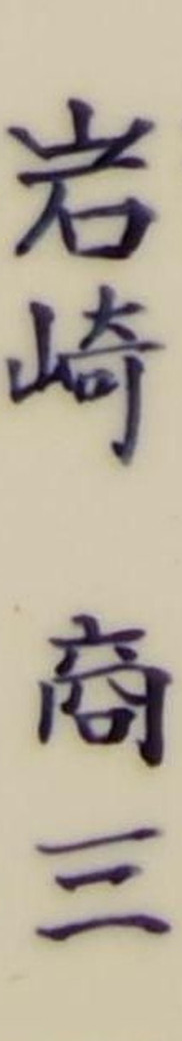岩崎商三
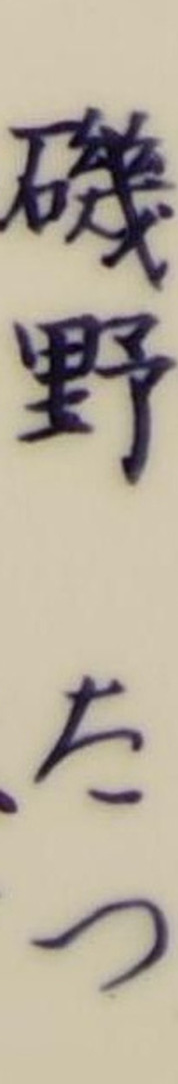磯野たつ
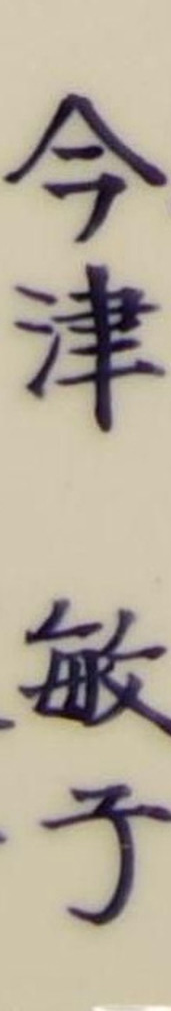今津敏子

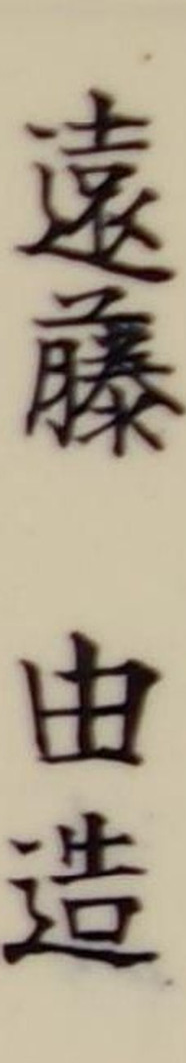遠藤由造
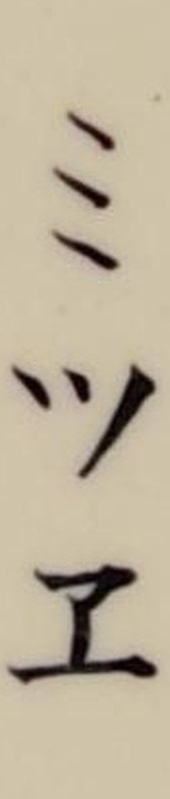ミツエ
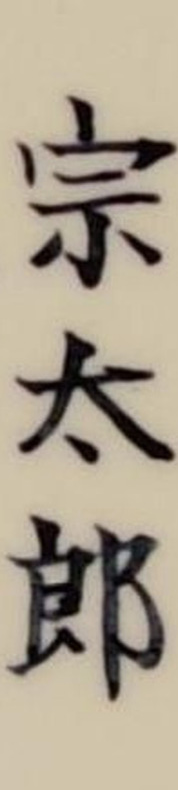宗太郎
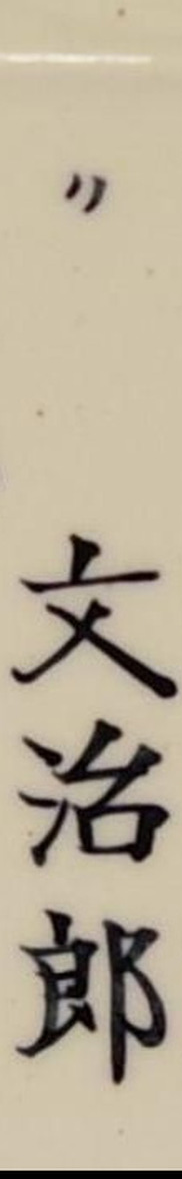文治郎
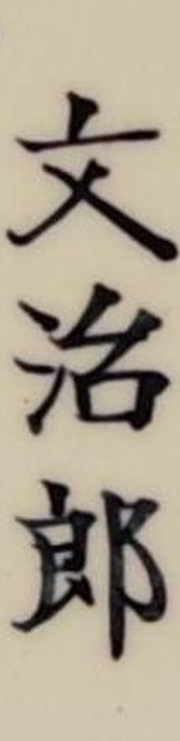文治郎
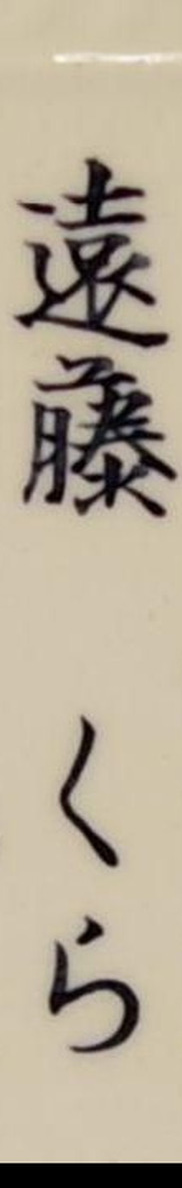遠藤くら
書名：E~L
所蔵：高野山金剛峯寺
